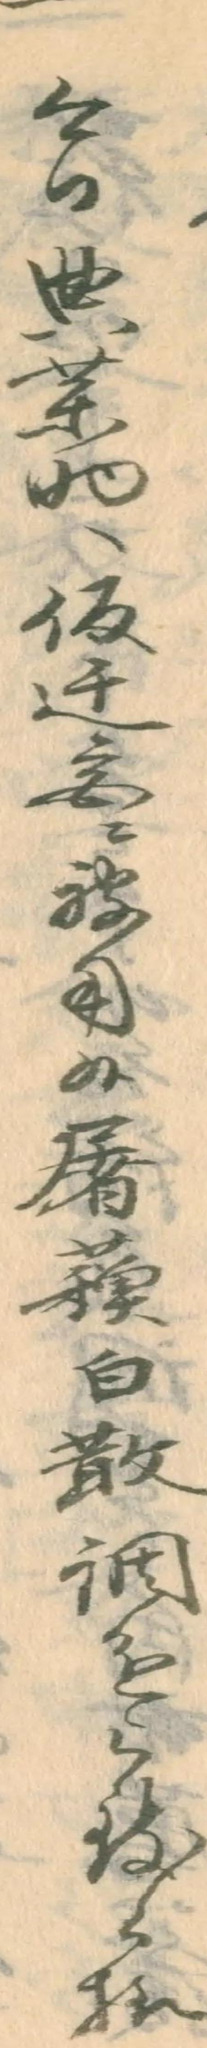一今日典薬物へ仮迁宮ニ被用候屠蘇白散調進被致候様
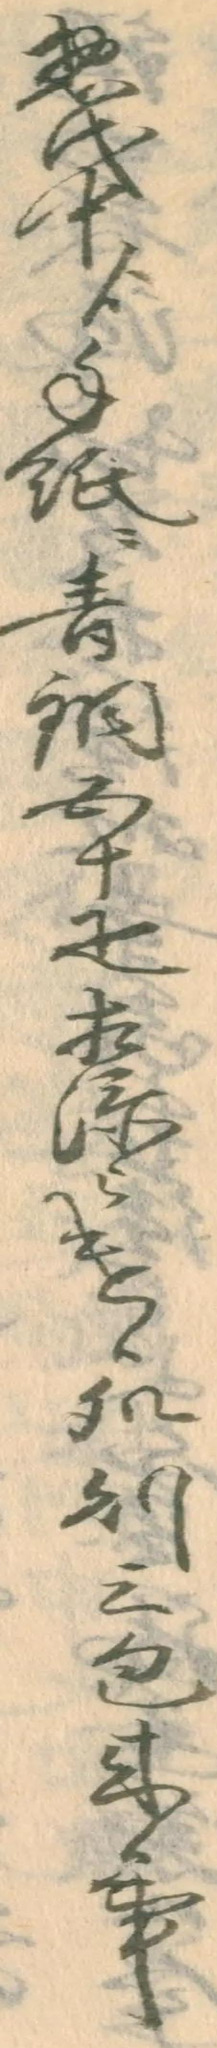惣代中ゟ手紙ニ青銅五十疋相添被遣候処則三包来候事
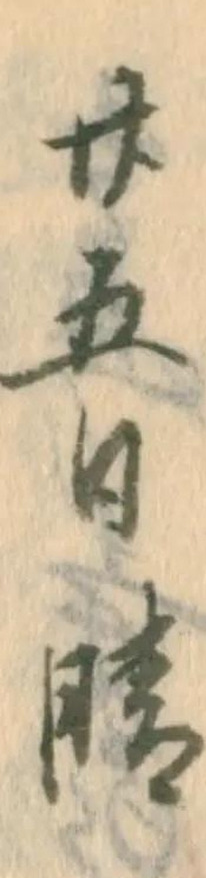廿五日晴
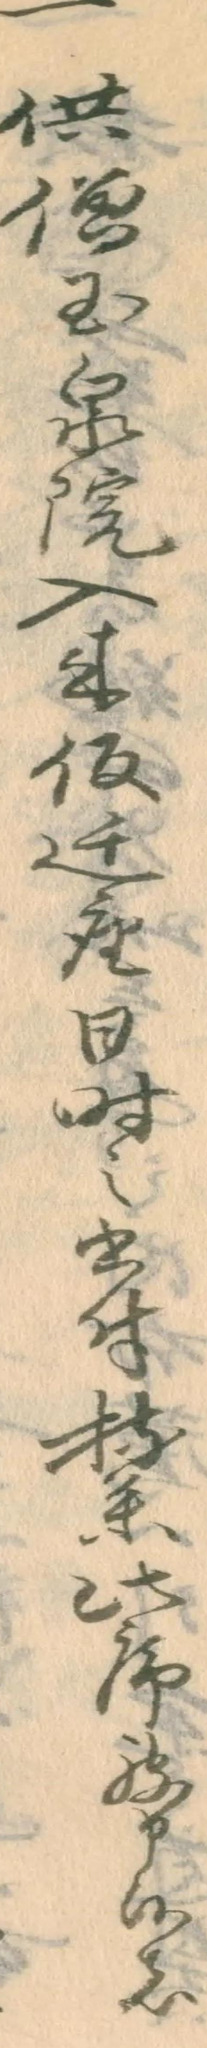一供僧玉泉院入来仮迁座日時之書付持参此席被申候は
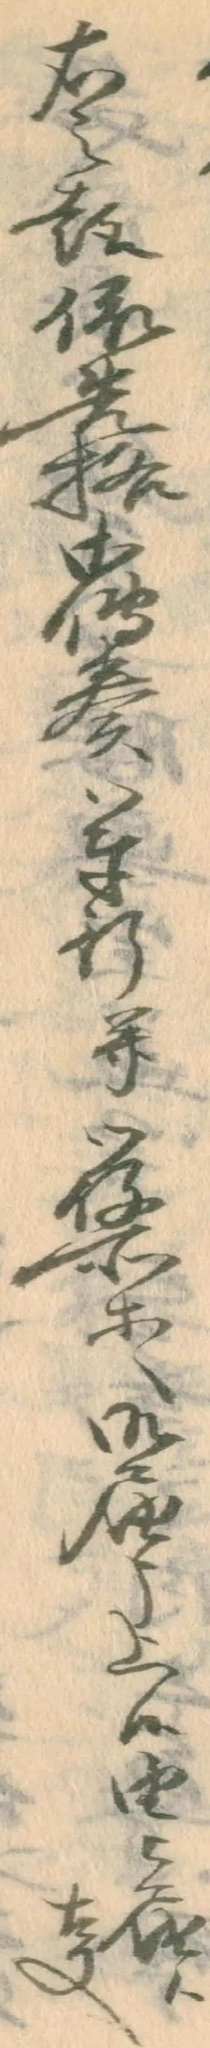右之趣依先格御伝奏御奉行并御役所等へ御届申上候由被届候事
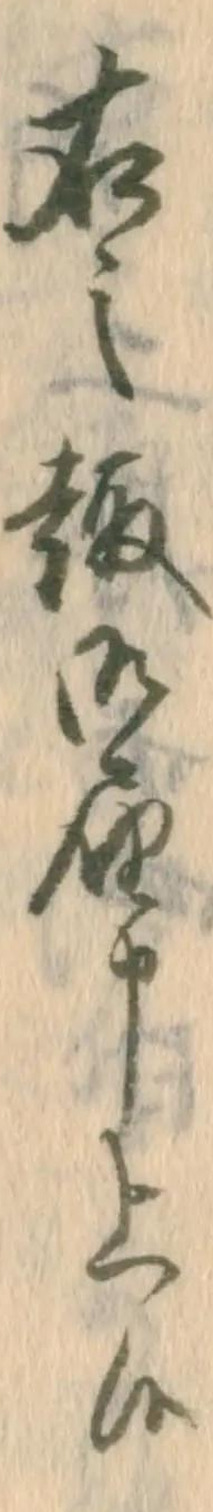右之趣御届申上候
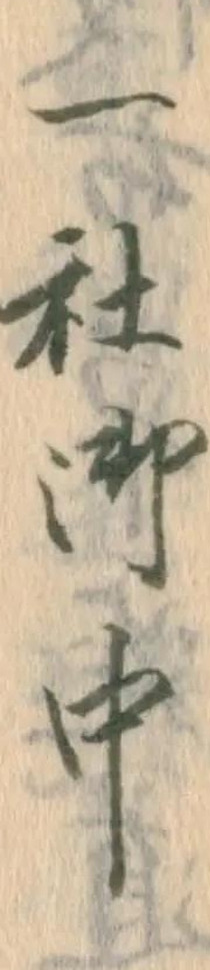一社御中
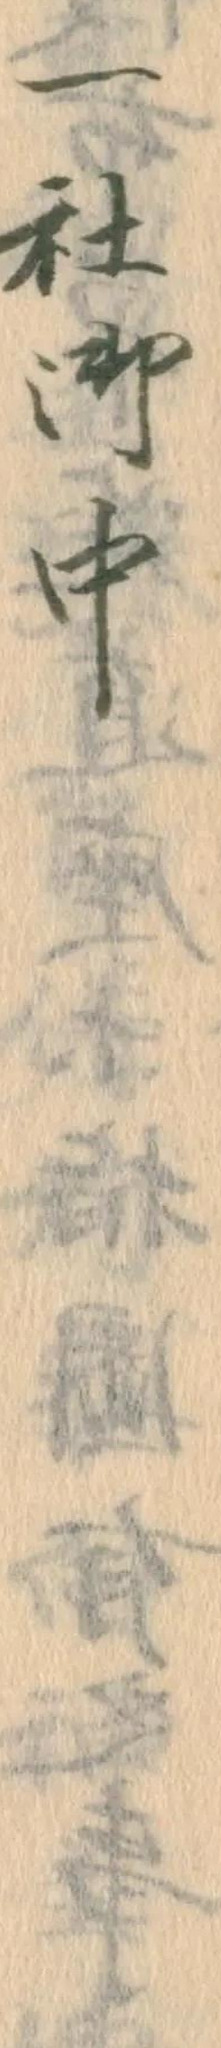一社御中
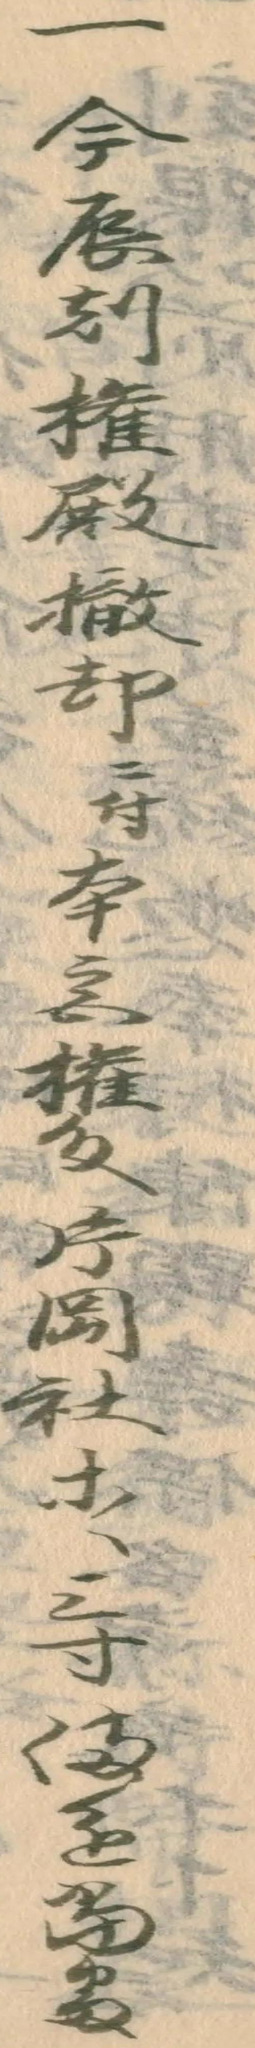一今辰刻権殿撤却ニ付本宮権殿片岡社等へ三寸備進当番
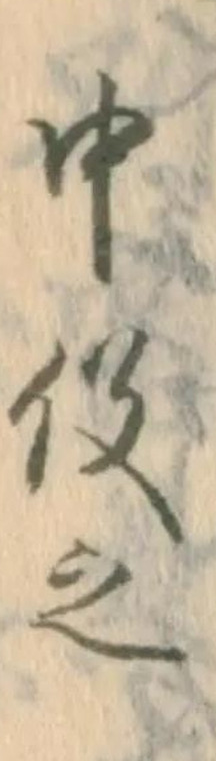中役之
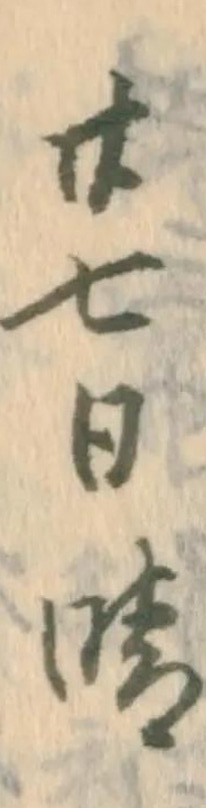廿七日晴
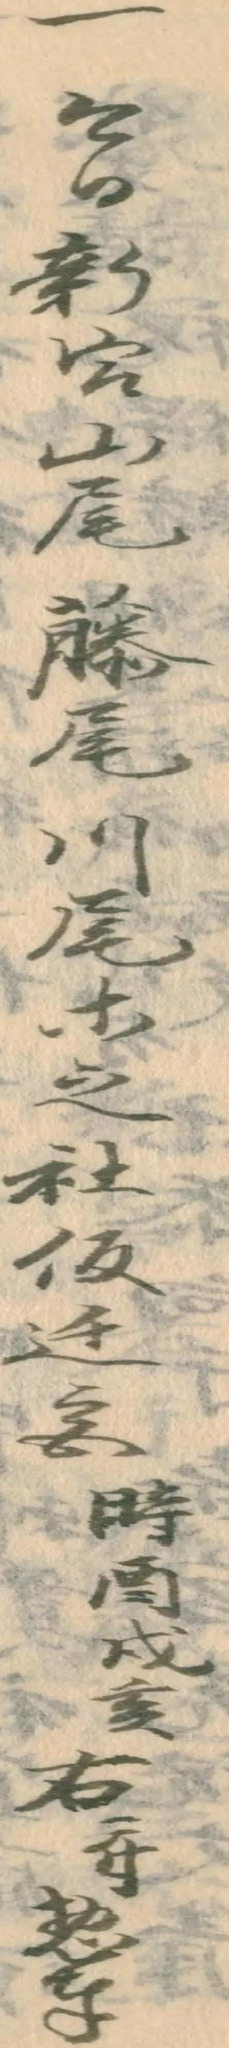一今日新宮山尾藤尾川尾等之社仮迁宮時酉戊亥右ニ付惣奉
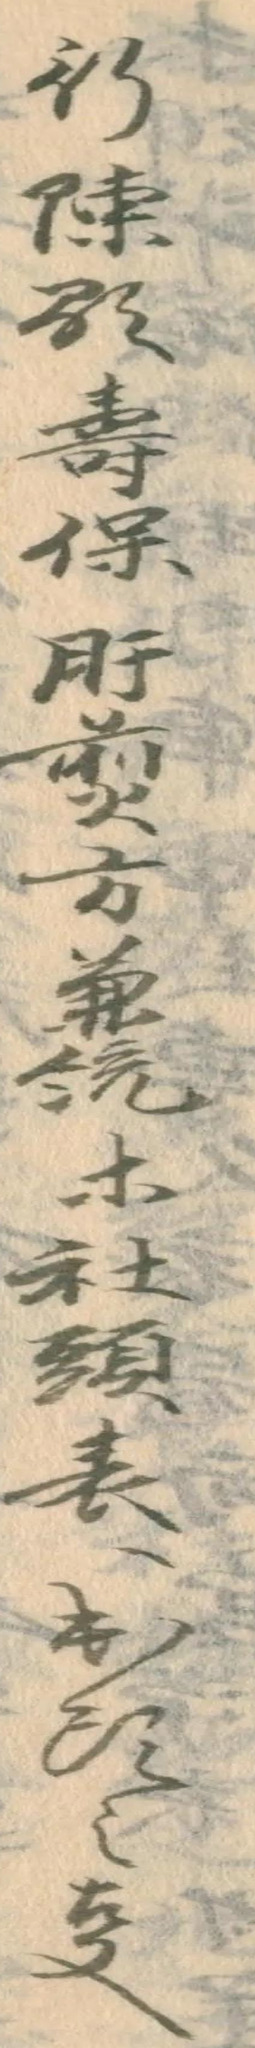行陳顕寿保肝煎方兼統等社頭表へ出頭之事
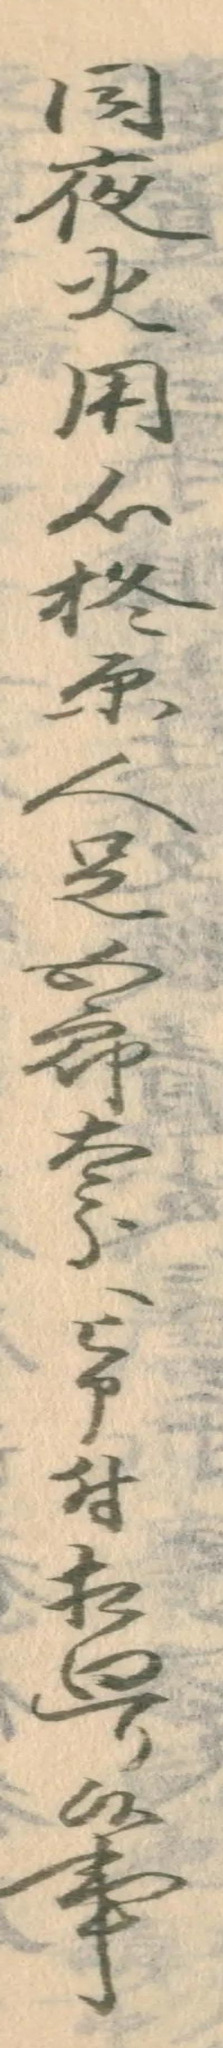一同夜火用心柊原人足五郎太郎へ被申付相廻り候事
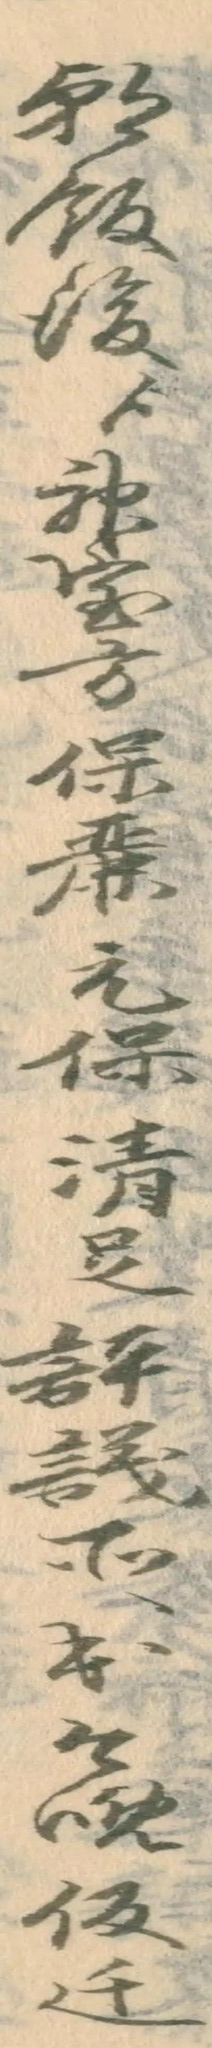一朝飯後ゟ神宝方保麗元保清足評議所へ出今晩仮迁
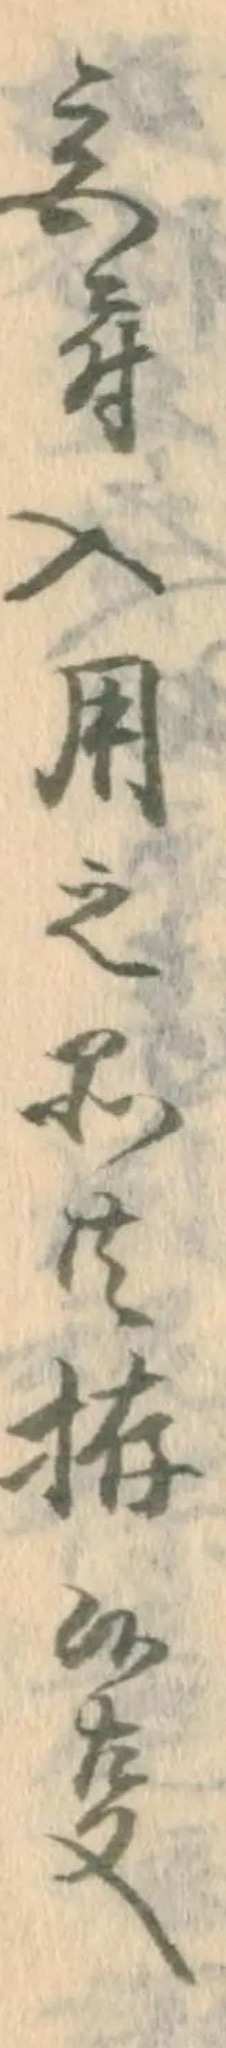宮ニ付入用之品共拵候事
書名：賀茂社記録. 第17冊
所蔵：国立国会図書館 National Diet Library, JAPAN
